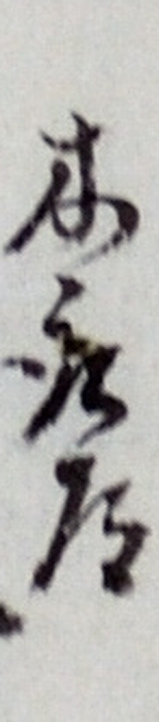木取道
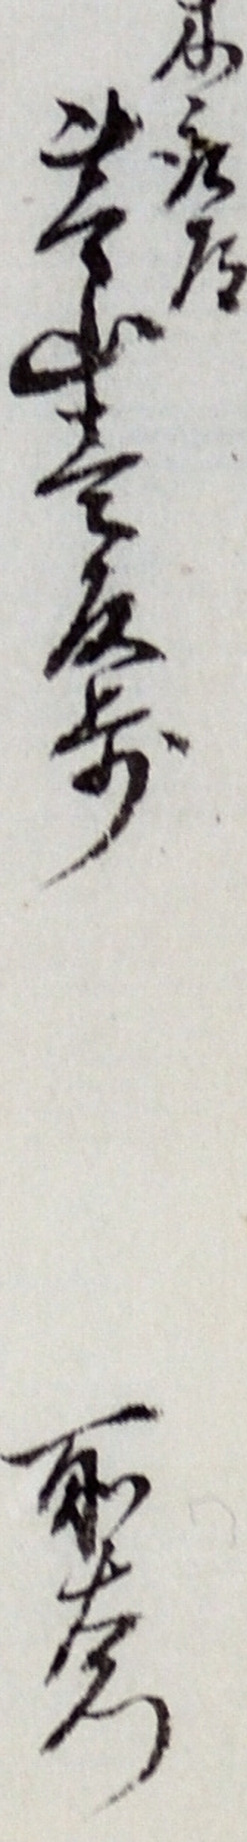芝山壱反歩所右衛門
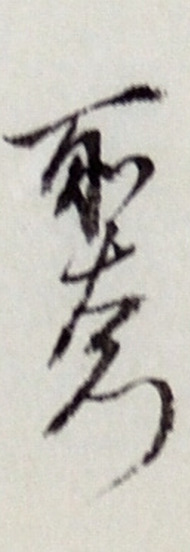庄右衛門
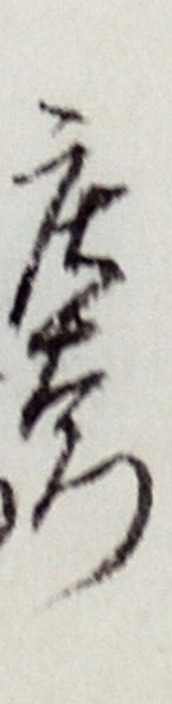庄右衛門
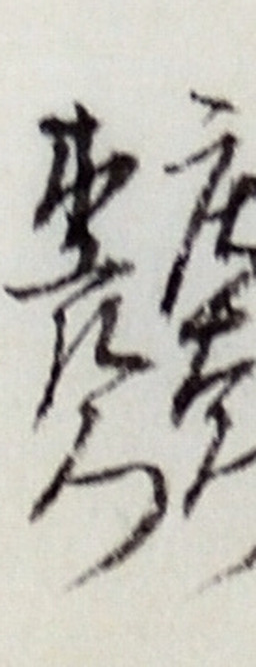杢左衛門
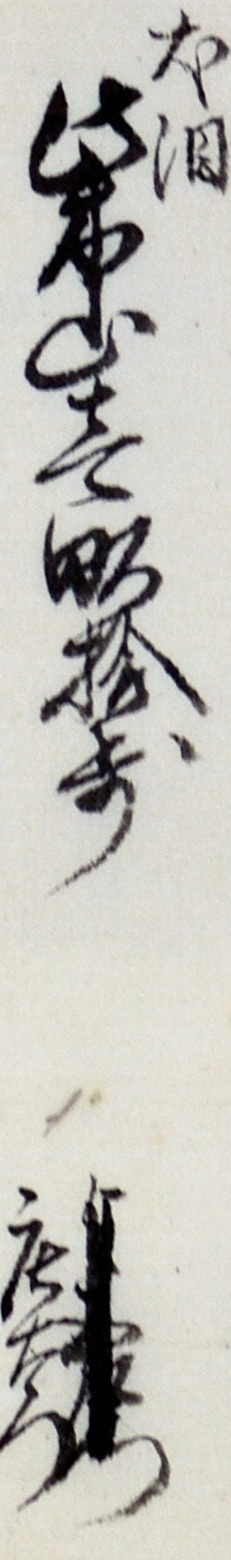芝山壱畝拾歩庄右衛門
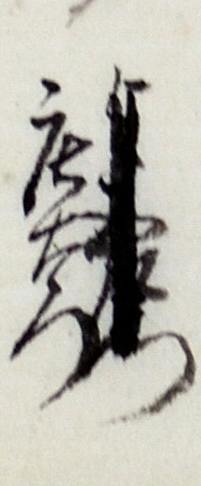庄右衛門
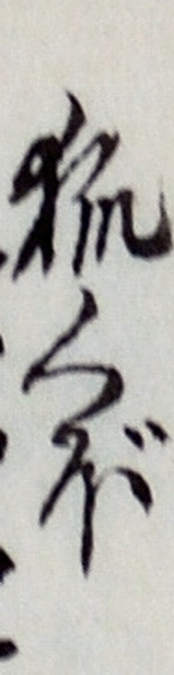狐くぼ
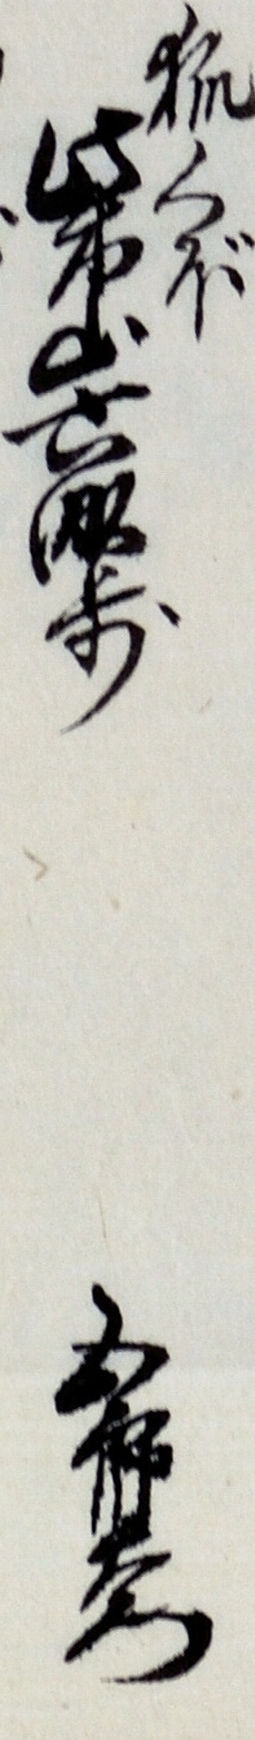柴山六畝歩五郎右衛門
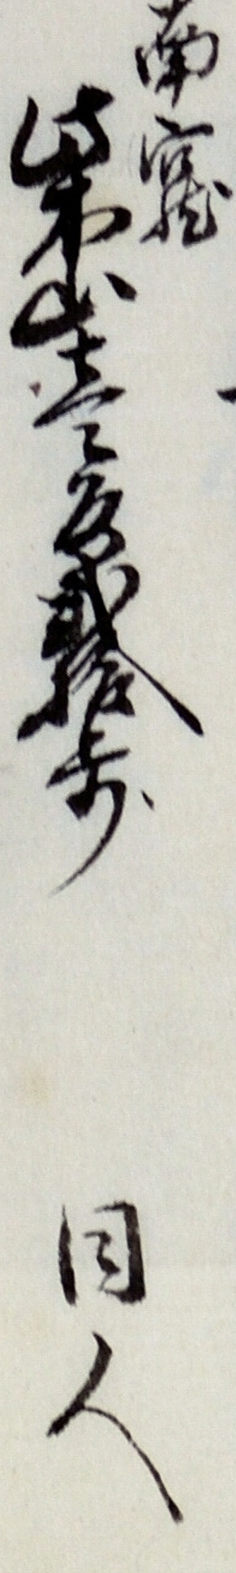柴山壱反弐拾歩同人
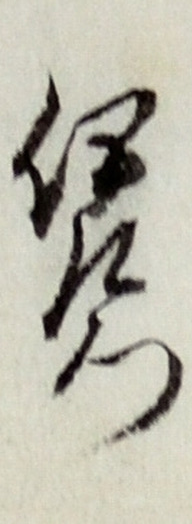杢左衛門
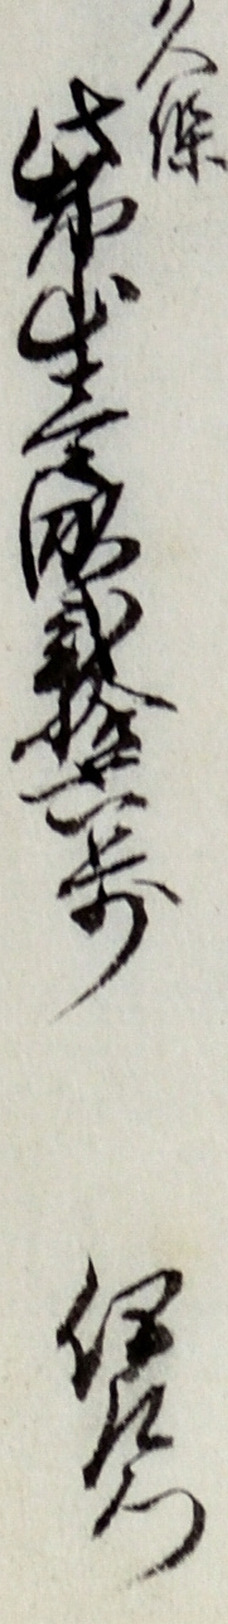柴山壱畝弐拾六歩伊左衛門
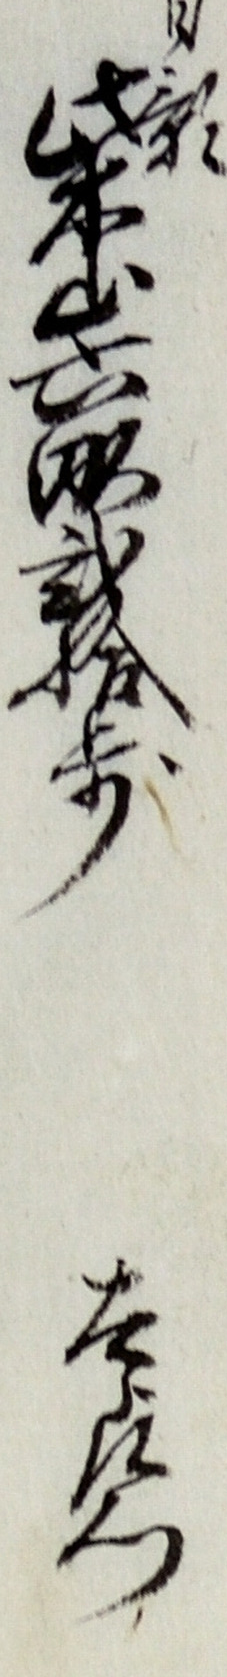柴山六畝弐拾歩太郎左衛門
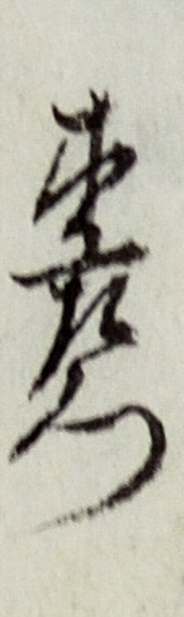杢左衛門
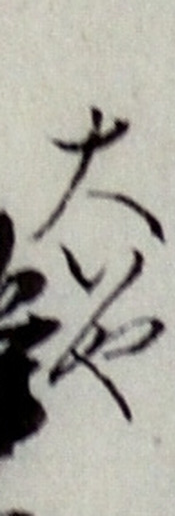大いや
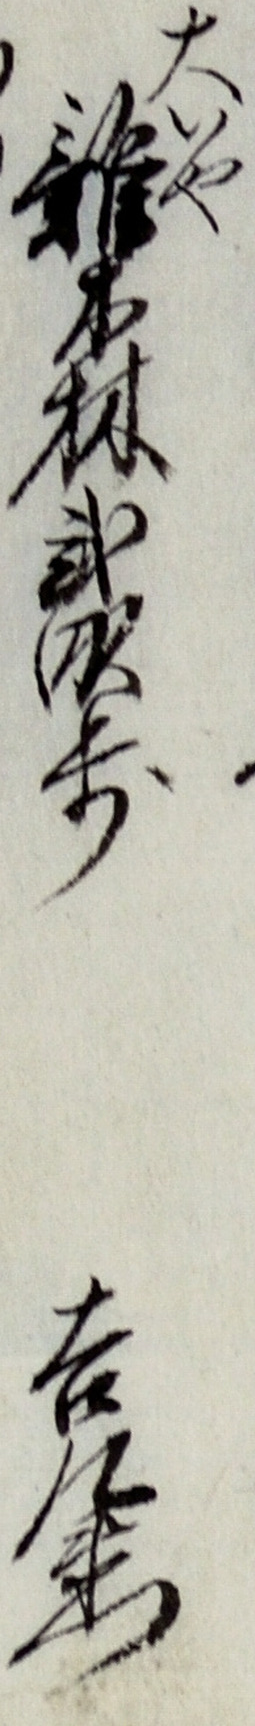雑木林弐畝歩吉左衛門
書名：御領分中山林社地手控
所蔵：伊那市立高遠町図書館・合同会社AMANE
